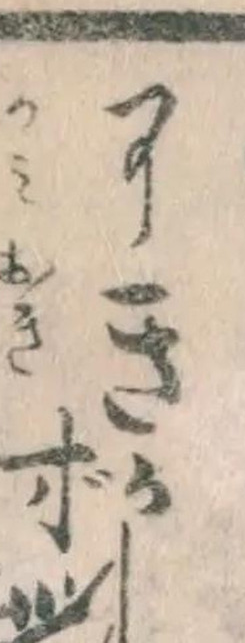にきかず
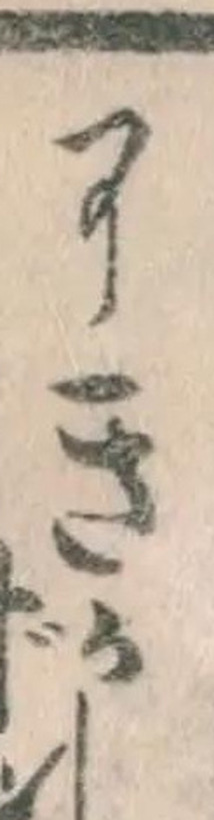にきかず
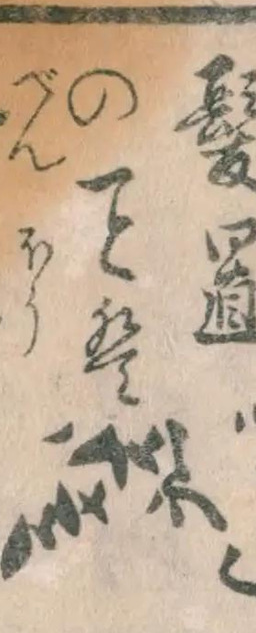のことは
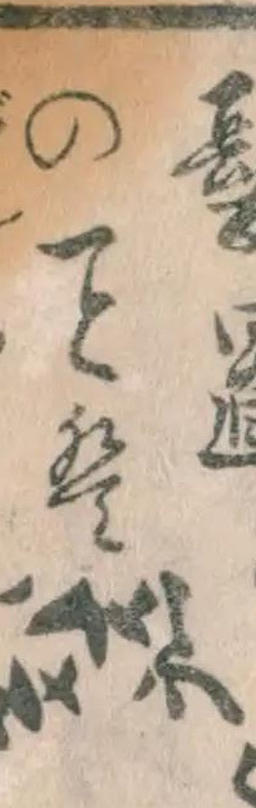のことは
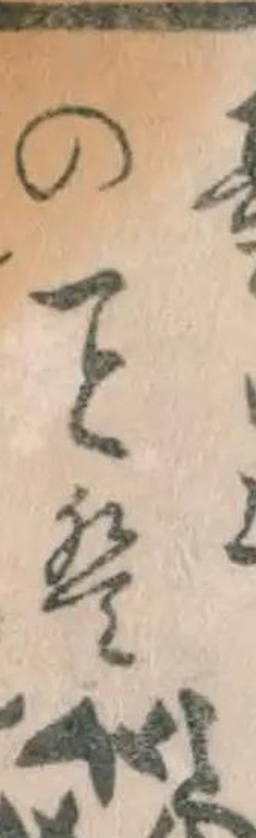のことは
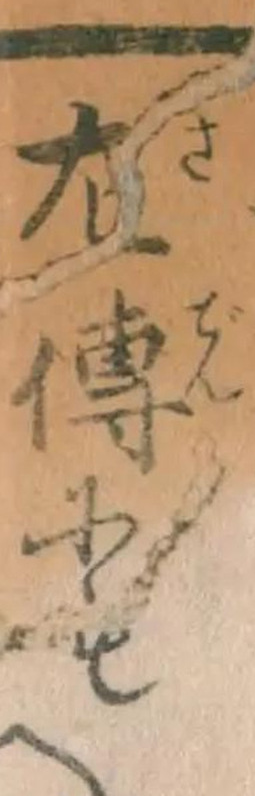左伝にも
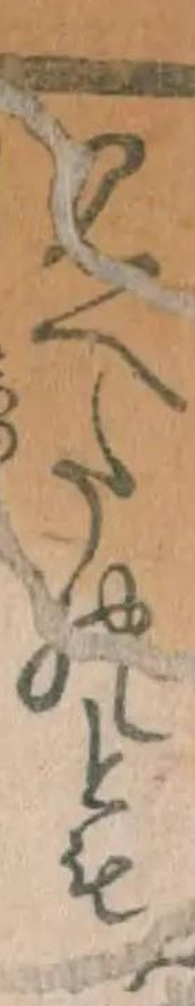見へたれとも
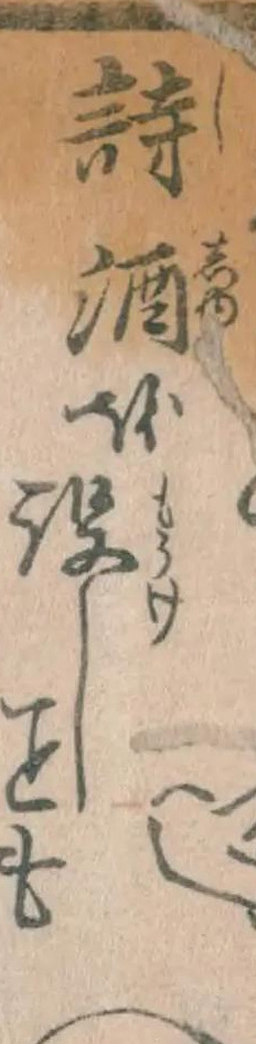詩酒を設しことも
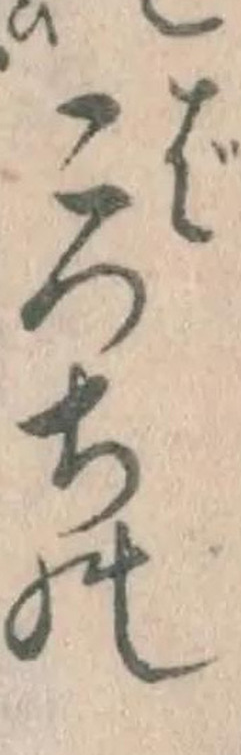こつちの
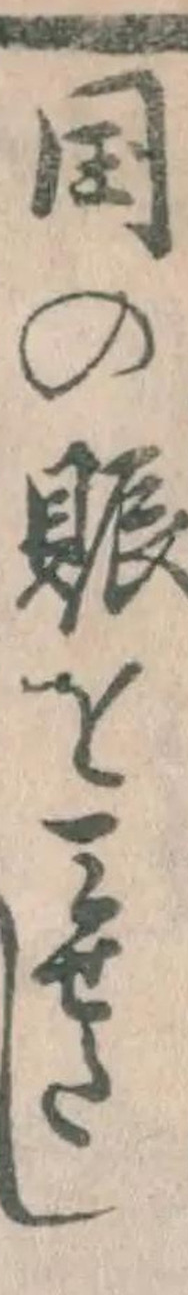国の賑をみせたし
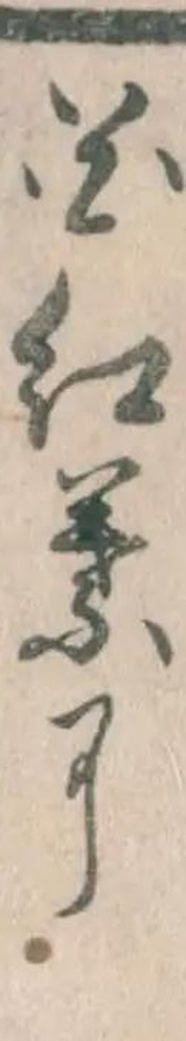花紅葉に
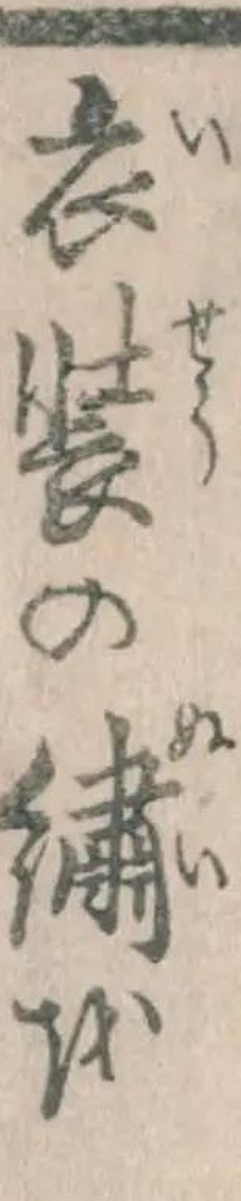衣装の繍を
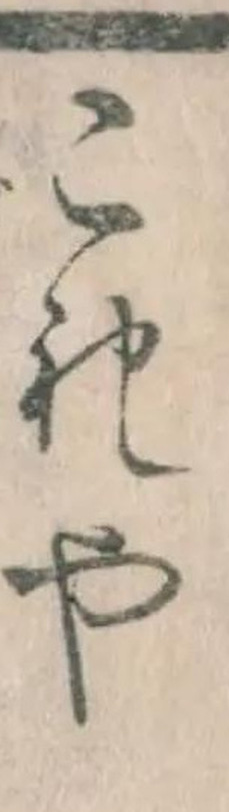これや
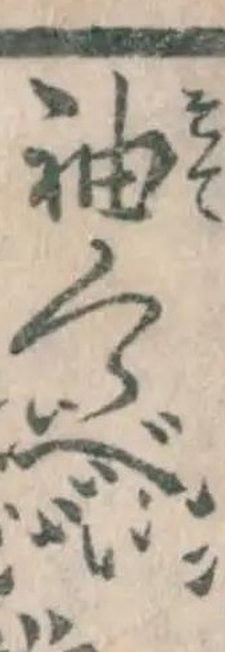袖くらべ
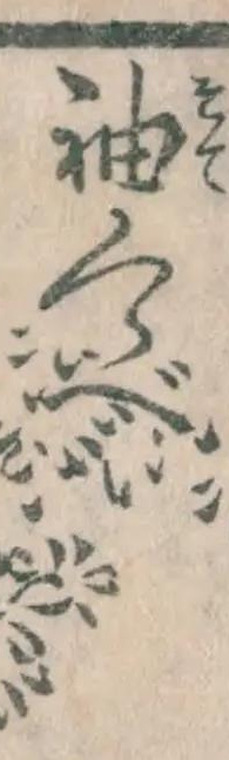袖くらべ

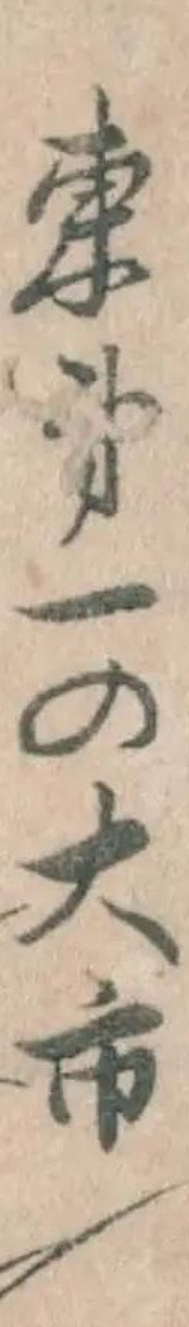東第一の大市
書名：絵本物見岡
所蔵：国立国会図書館 National Diet Library, JAPAN
